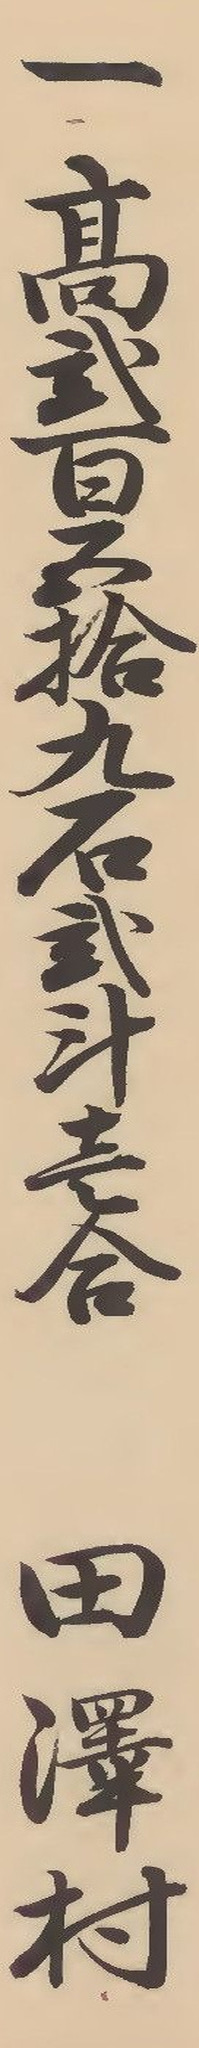一高弐百五拾九石弐斗壱合田沢村
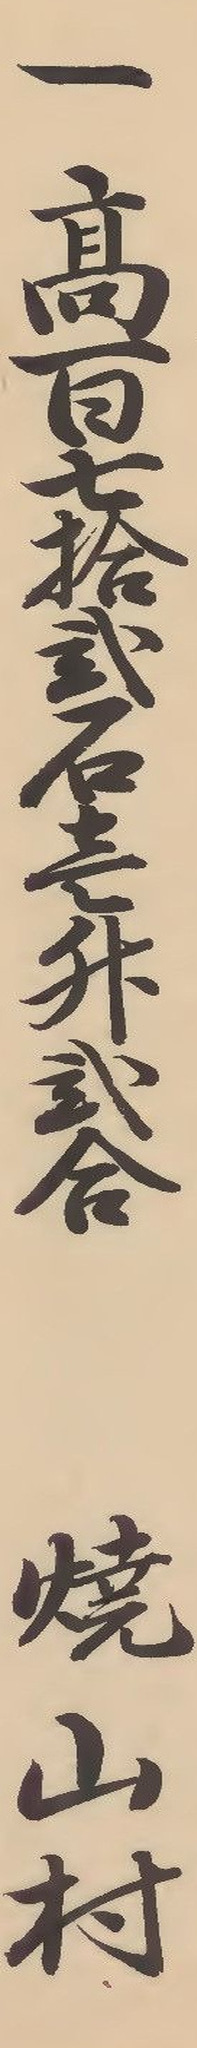一高百七拾弐石壱升弐合焼山村
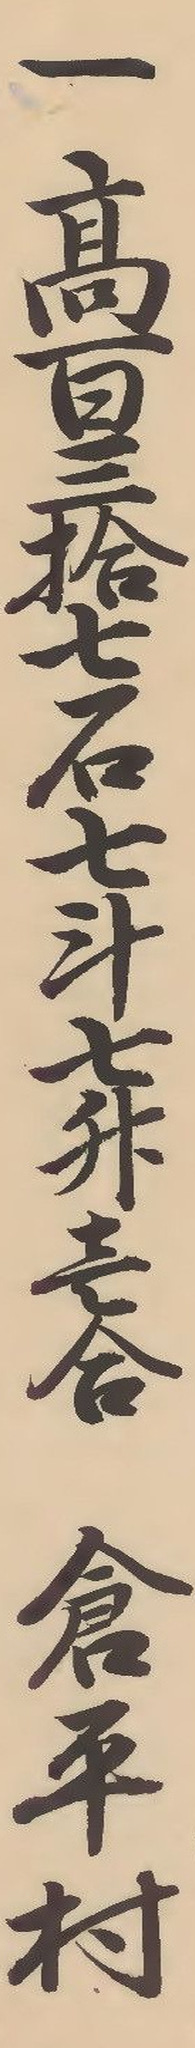一高百三拾七石七斗七升壱合倉平村

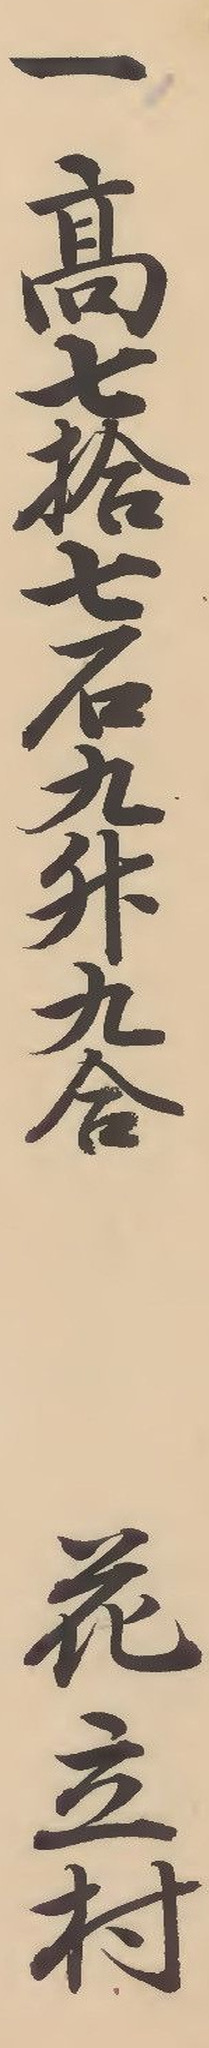一高七拾七石九升九合花立村
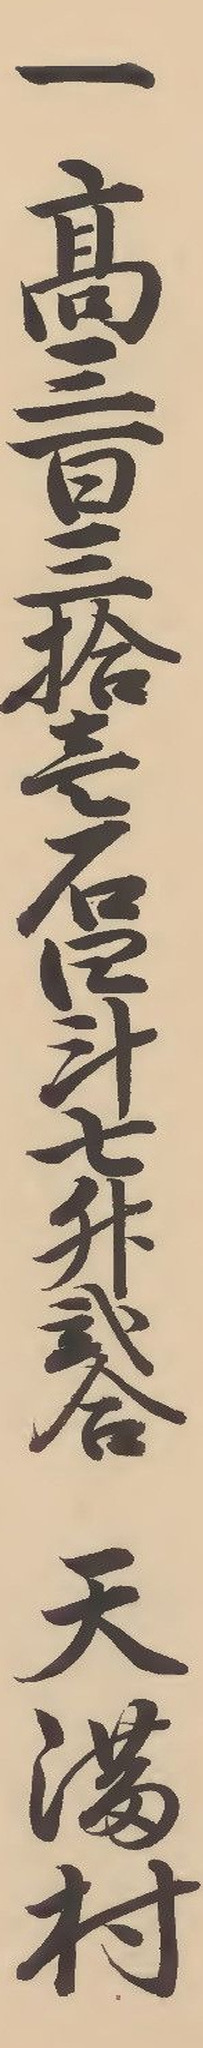一高三百三拾壱石四斗七升弐合天満村
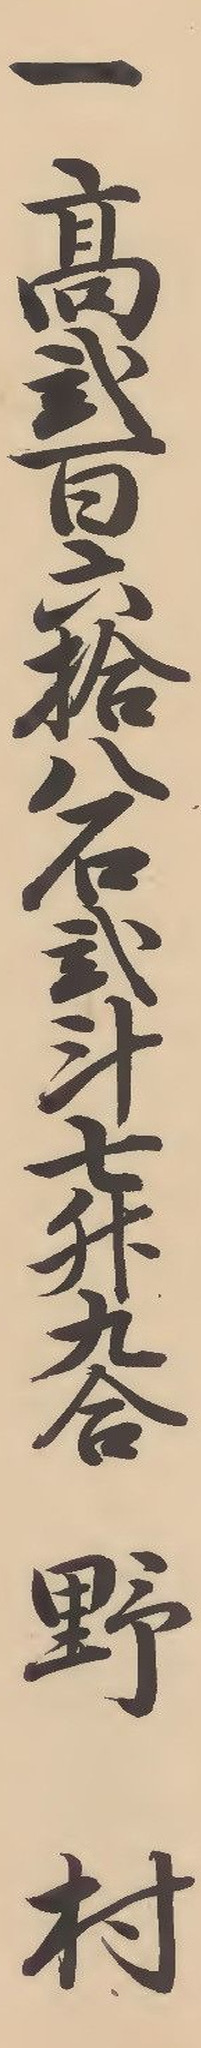一高弐百六拾八石弐斗七升九合野村
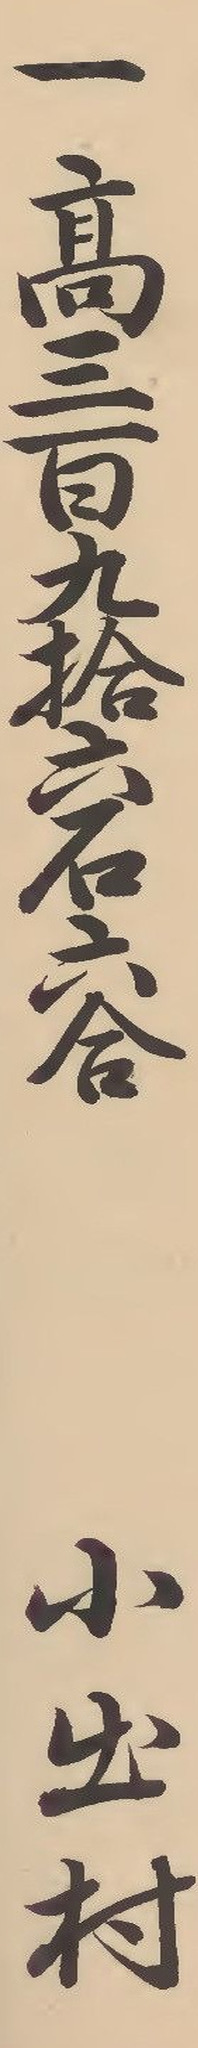一高三百九拾六石六合小出村
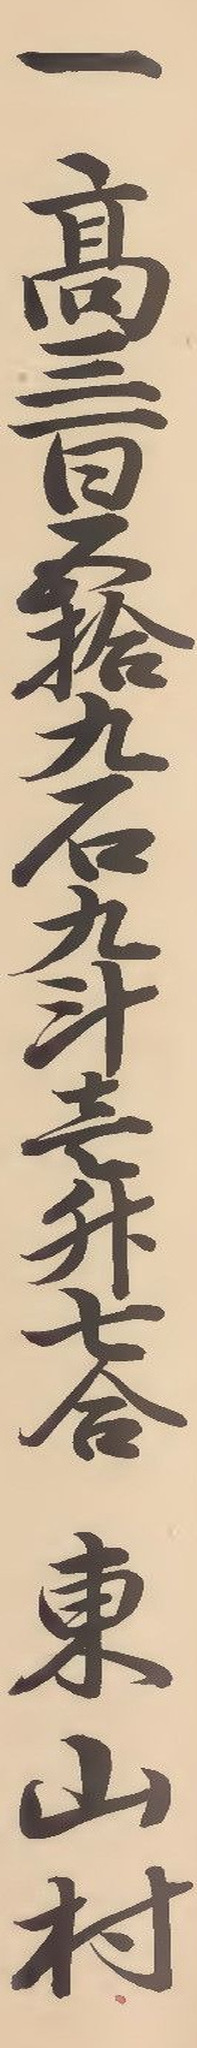一高三百五拾九石九斗壱升七合東山村
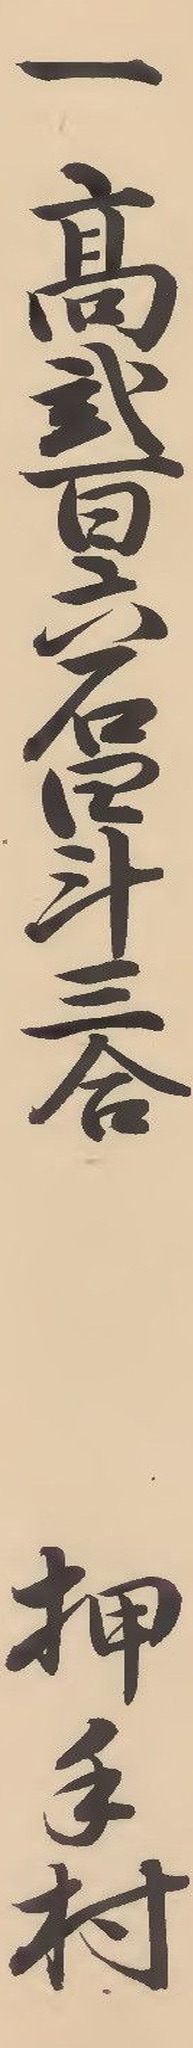一高弐百六石四斗三合押手村
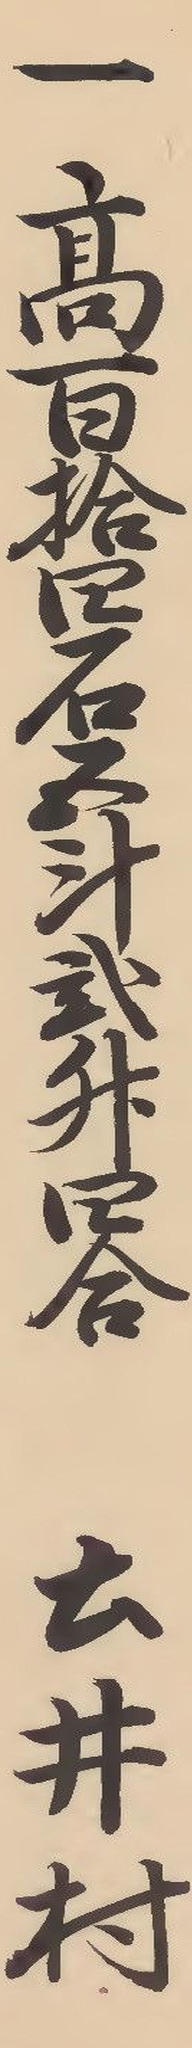一高百拾四石五斗弐升四合土井村
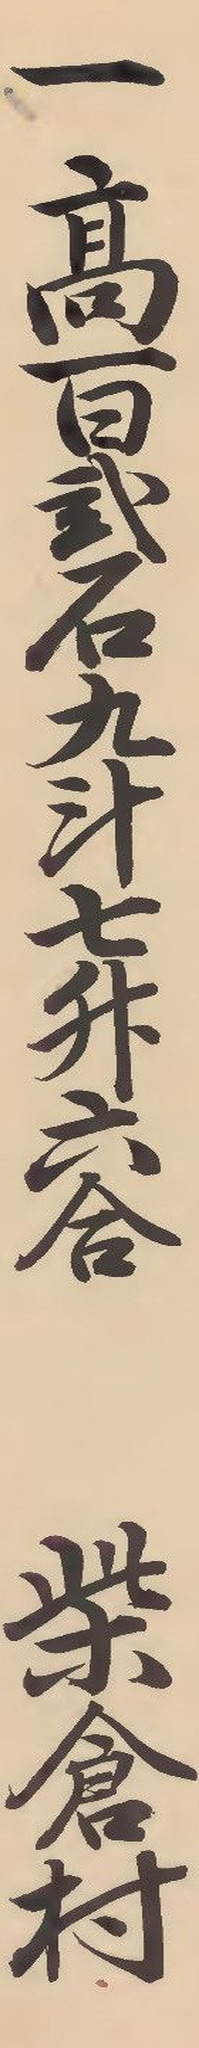一高百弐石九斗七升六合柴倉村

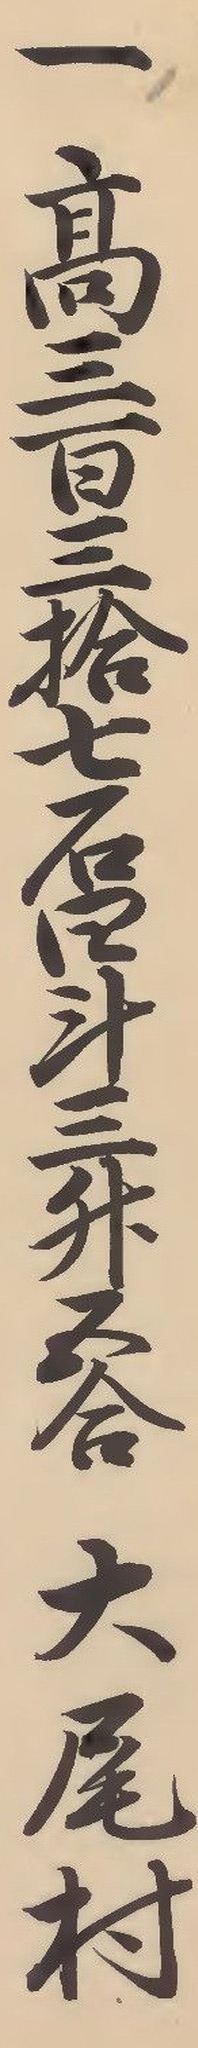一高三百三拾七石四斗三升五合大尾村
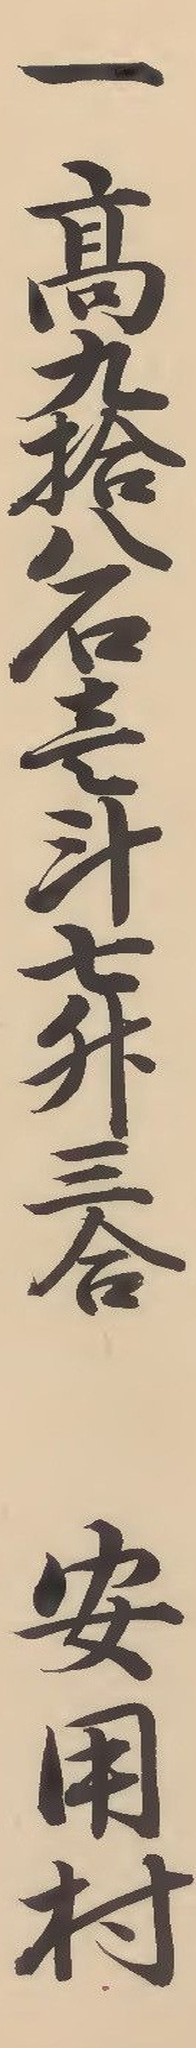一高九拾八石壱斗七升三合安用村
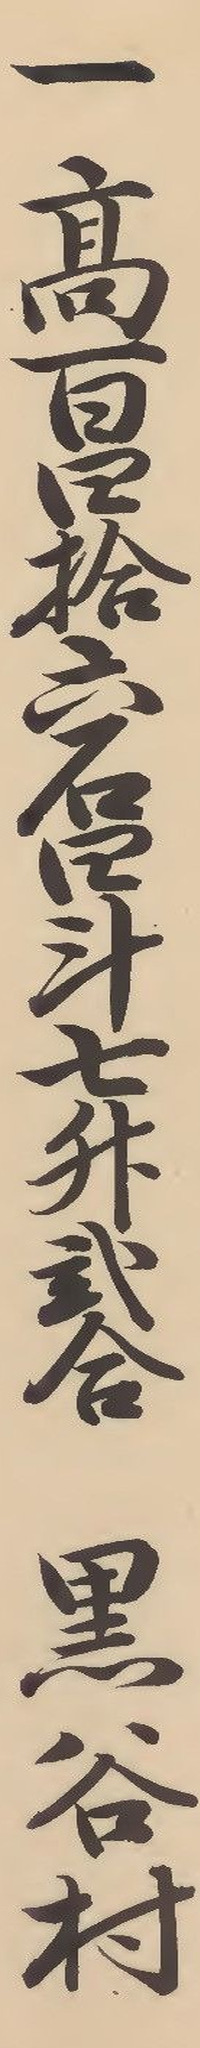一高百四拾六石四斗七升弐合黒谷村
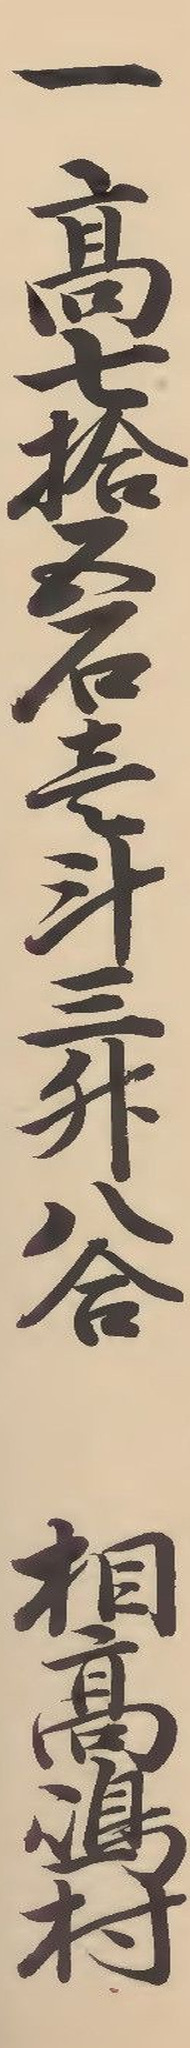一高七拾五石壱斗三升八合相高島村
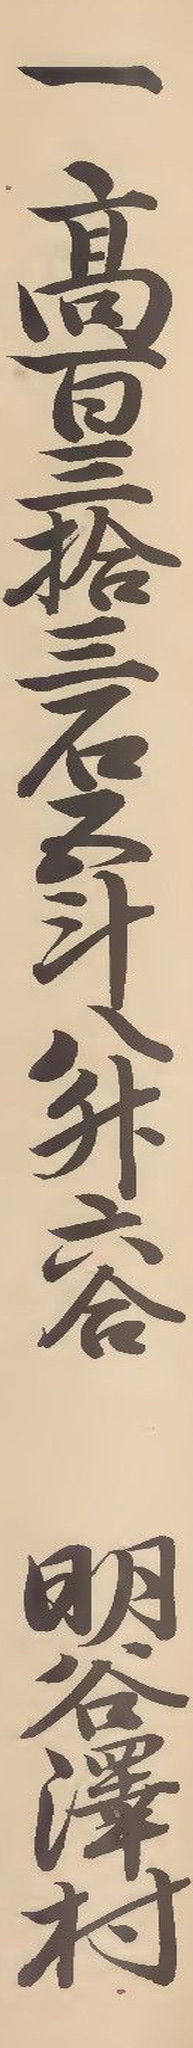一高百三拾三石五斗八升六合明谷沢村
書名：越後国郷帳　下
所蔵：国立公文書館 National Archives of Japan
